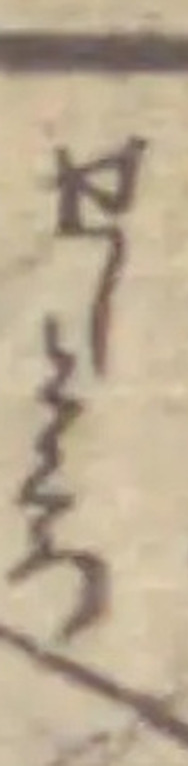せしところ
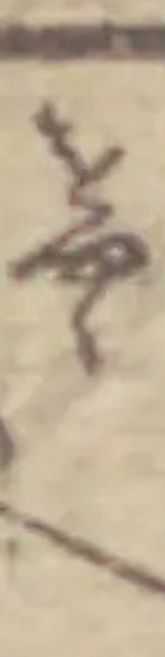をやく
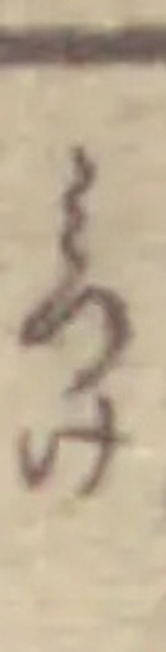みつけ
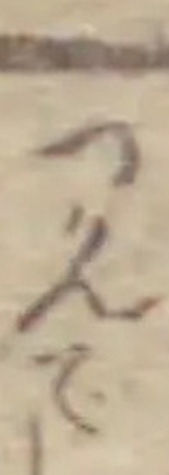つかんで
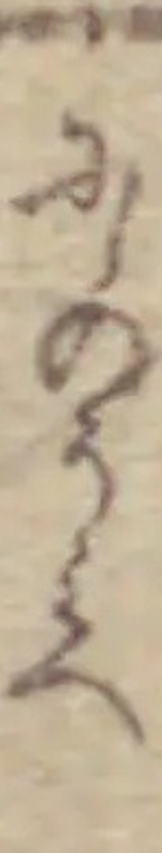にしのうみへ
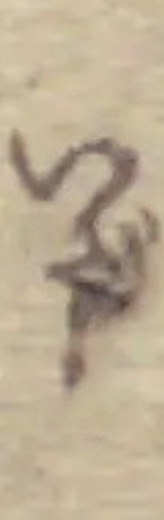いだし

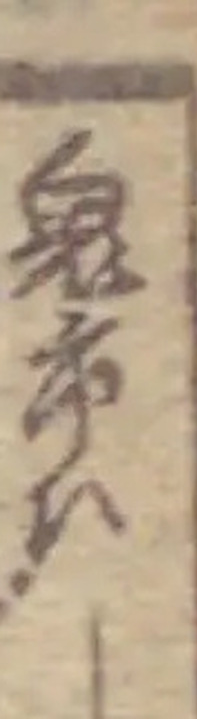鬼市は
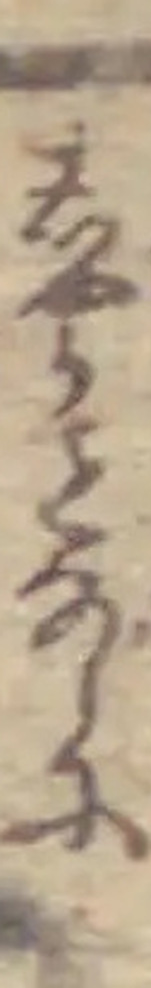しやうことなしに
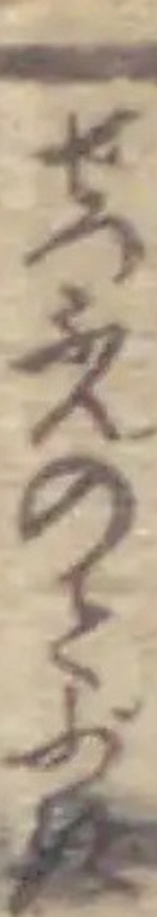せつふんのとうき
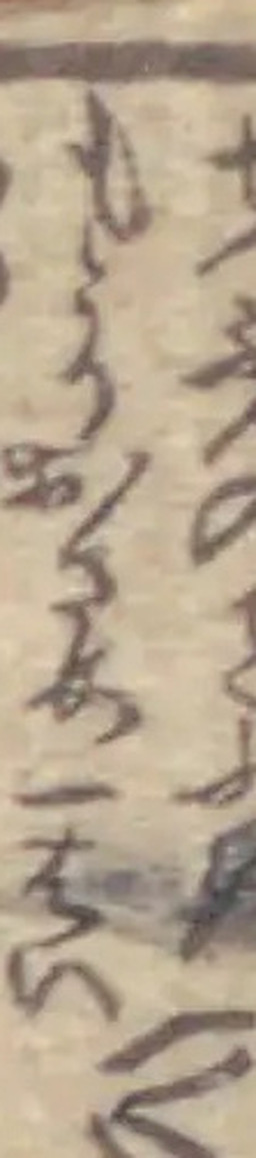もゝうおさめ一はい
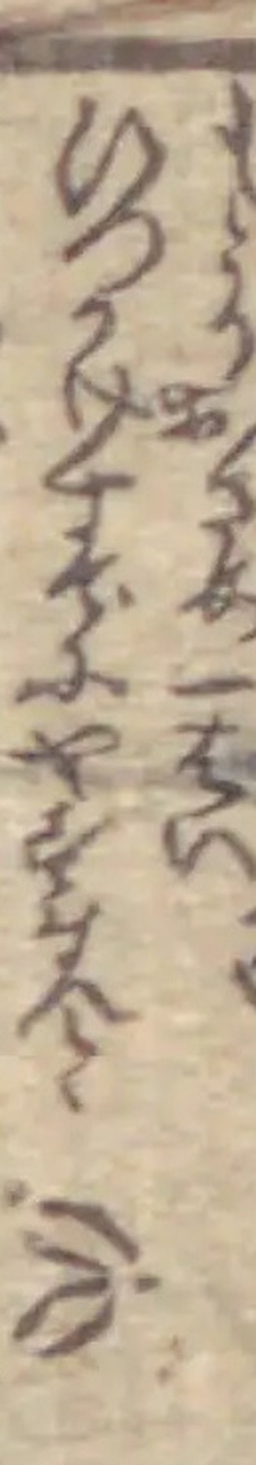ひつかけすでにやすまんと
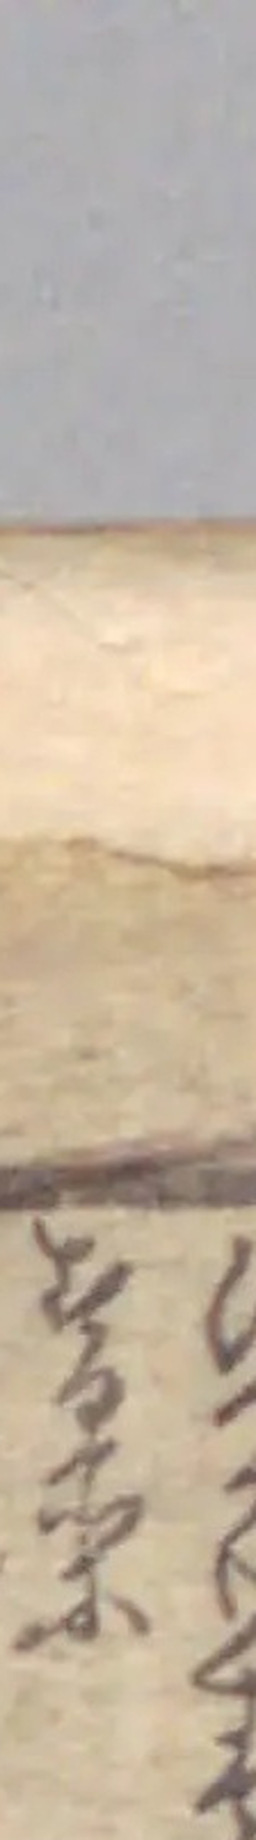する所に
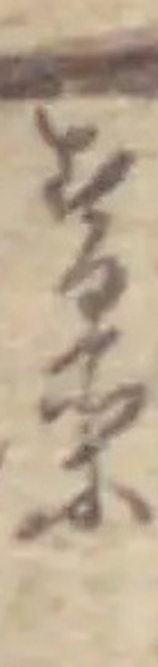する所に
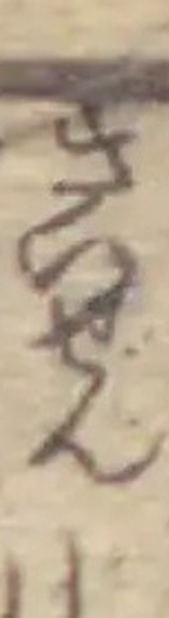さいぜん
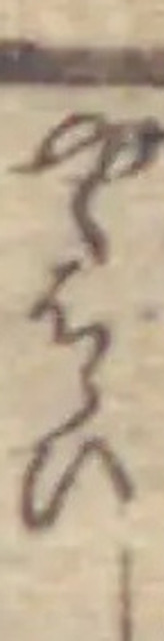やくはらい
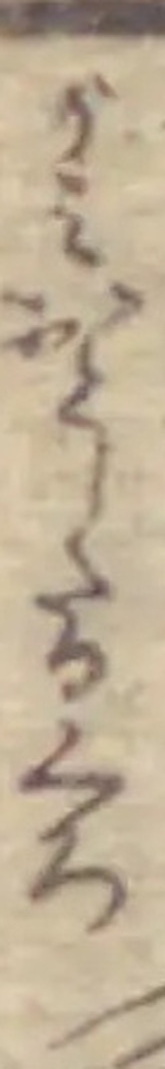かみおとしたるくろ
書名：鬼子宝 3巻
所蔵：国立国会図書館 National Diet Library, JAPAN
